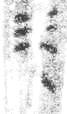而
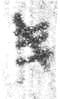母
